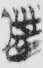○（僕）
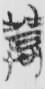登
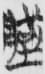○（臧）
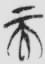而
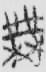無
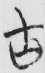古（故）
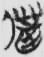○（僕）
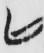㠯（以）
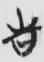告
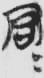君君
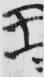王王
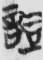○（屬）
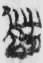○（僕）
